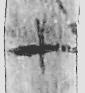七
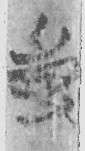尃
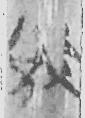敓（說）
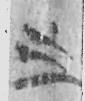之
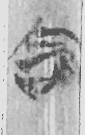命
